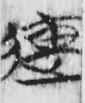連
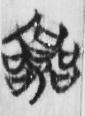囂
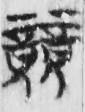競
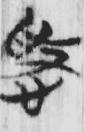愋
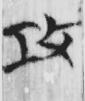攻
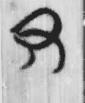尹
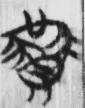賹
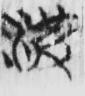波
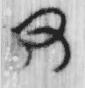尹
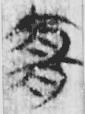宜
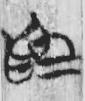爲
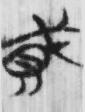貸
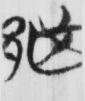○（越）
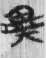異
